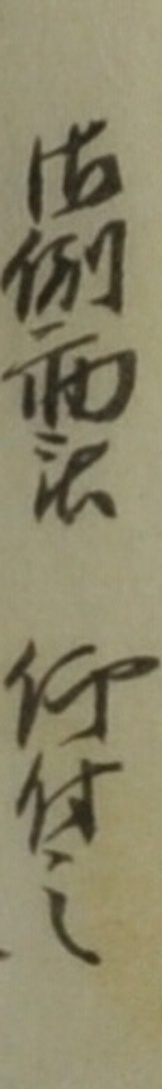御側勤被仰付之
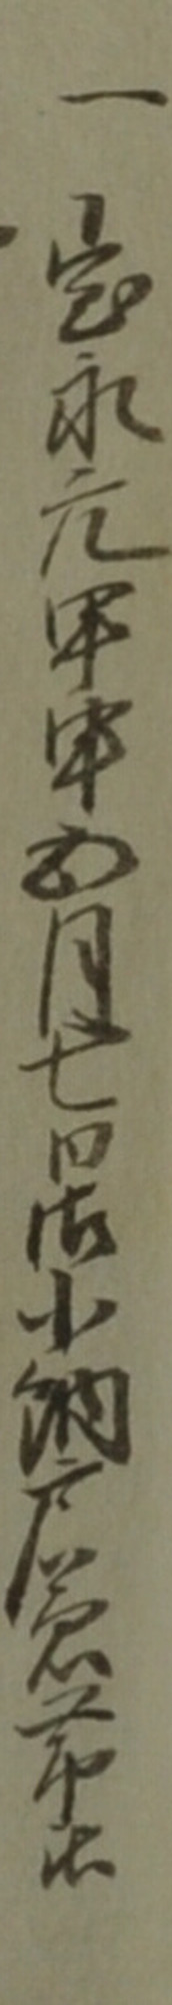一宝永元甲申五月七日御小納戸兼帯被
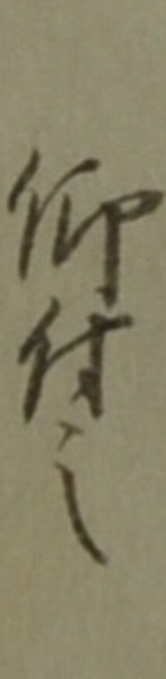仰付之
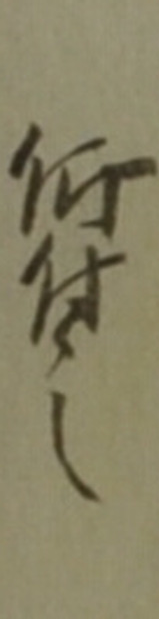仰付之
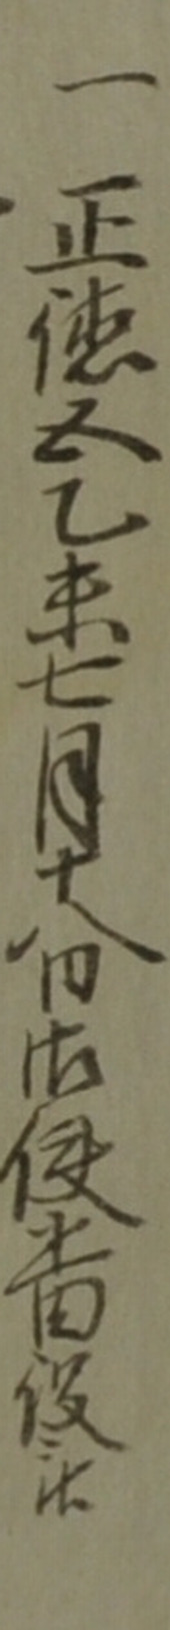一正徳五乙未七月十八日御使番役被
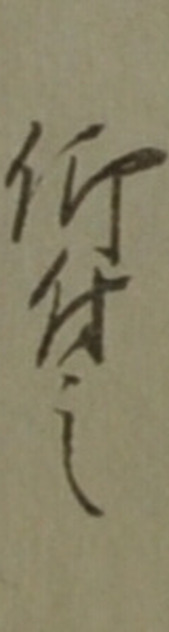仰付之
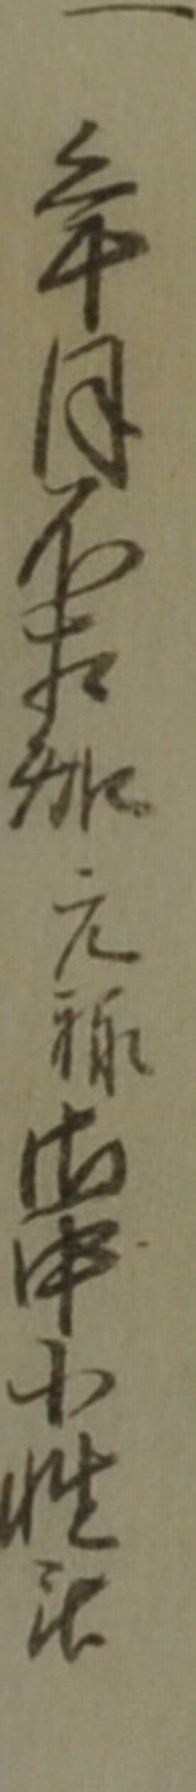一年月不相知元禄御中小性被
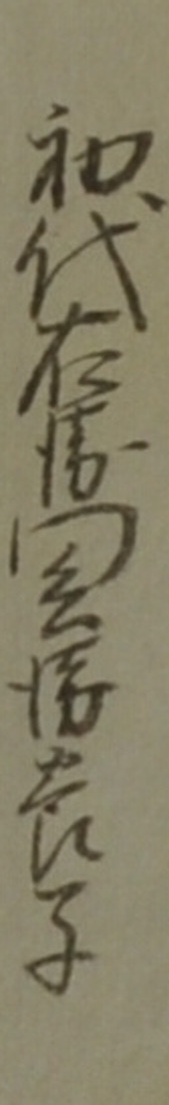初代右衛門兵衛養子
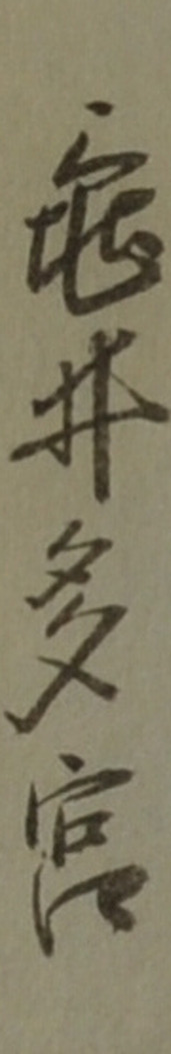亀井多宮
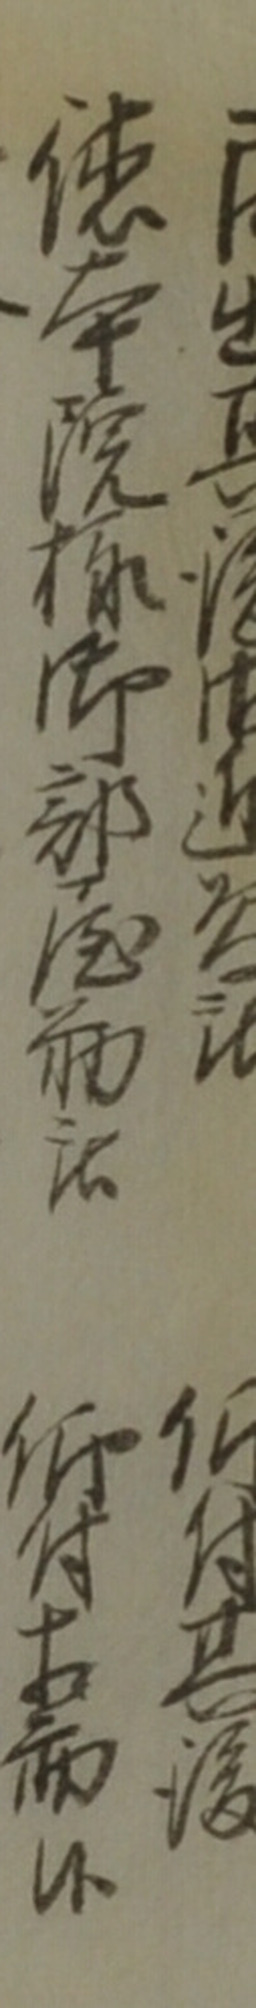徳本院様御部屋勤被仰付相勤候
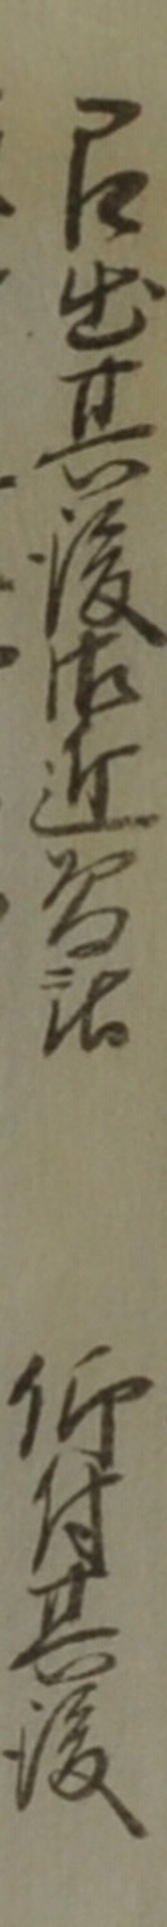召出其後御近習被仰付其後
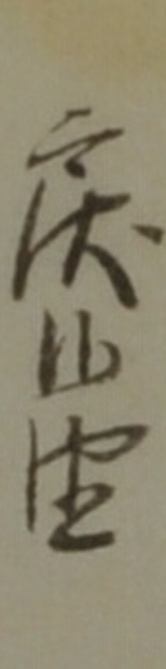戻候由
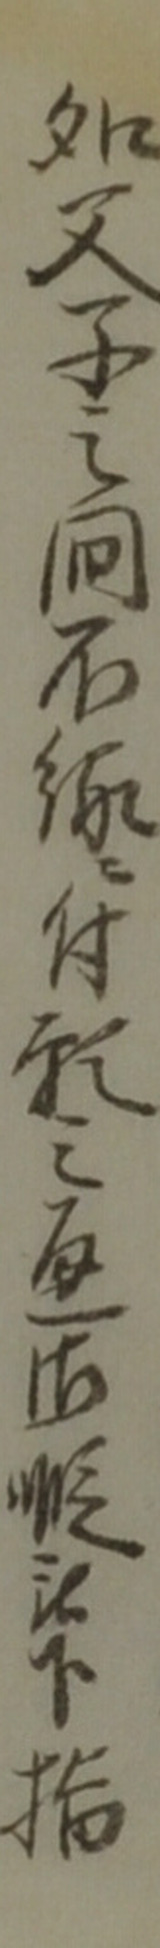処父子之間不縁ニ付願之通御暇被下指
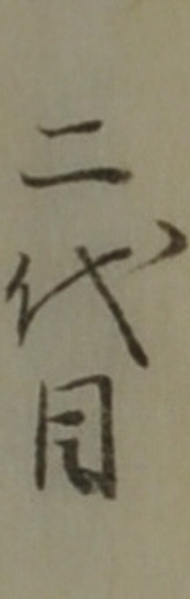二代目
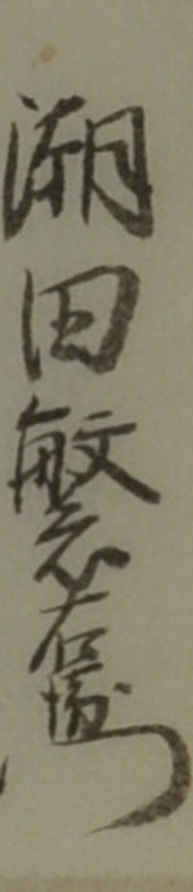潮田繁右衛門
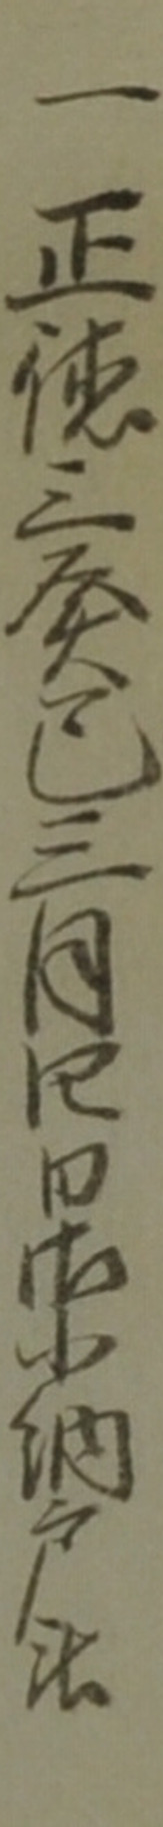一正徳三癸巳三月四日御小納戸被
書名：諸御役代々録（五）
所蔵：伊那市立高遠町図書館・合同会社AMANE
